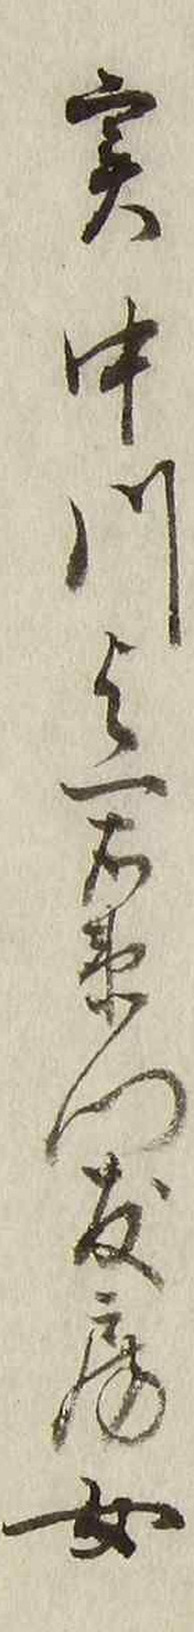実中川与一右衛門友房女
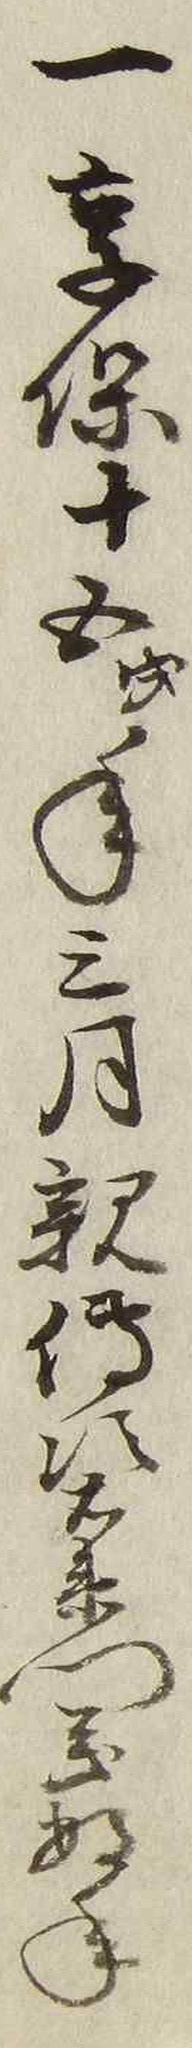一享保十五戌年三月親伝次右衛門義数年

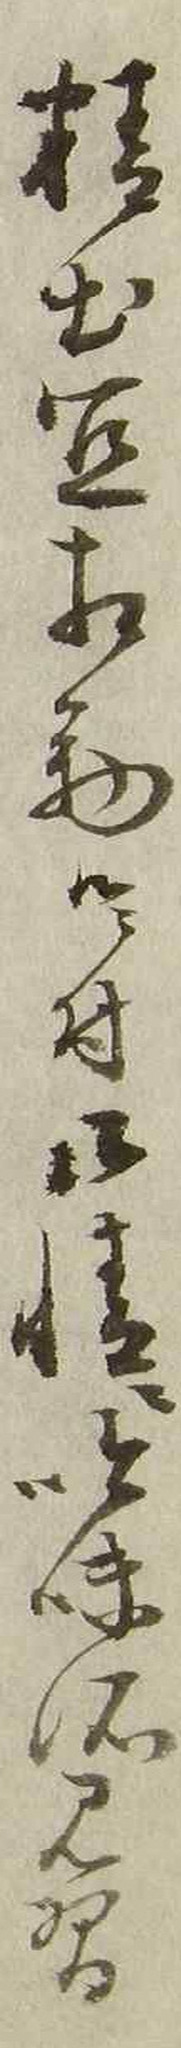精出宜相勤候ニ付御情ニ吟味所見習
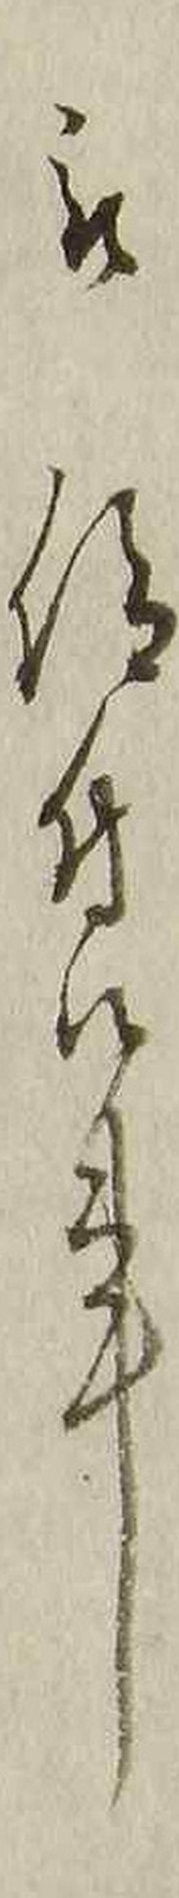被仰付候事
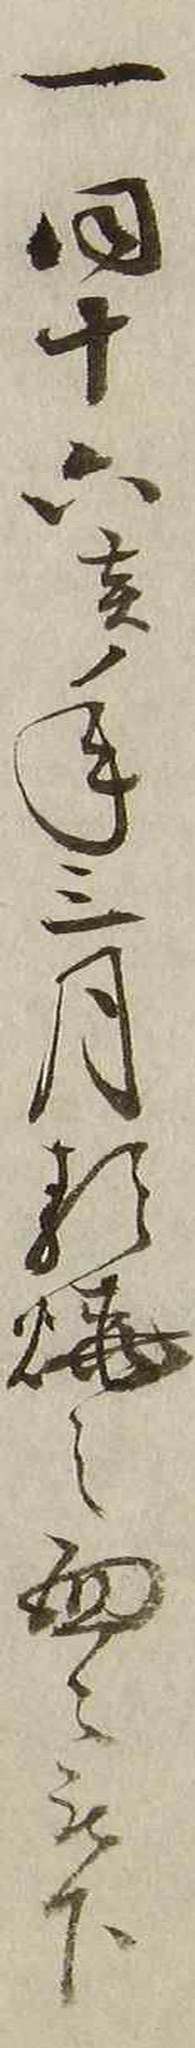一同十六亥年三月類焼之面々被下
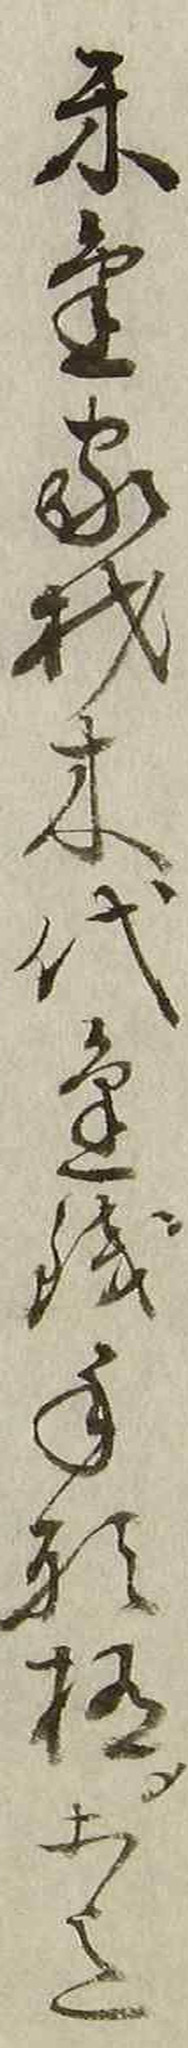米金家材木代金銭手形極メ等迄
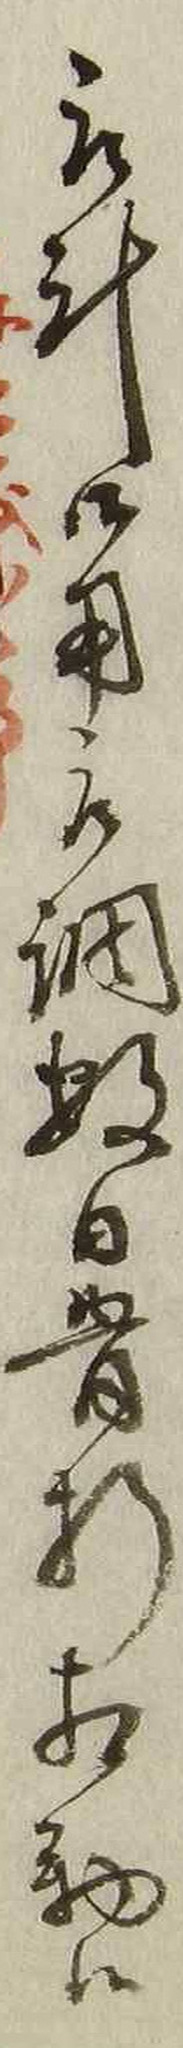取計御用取調数日骨折相勤候
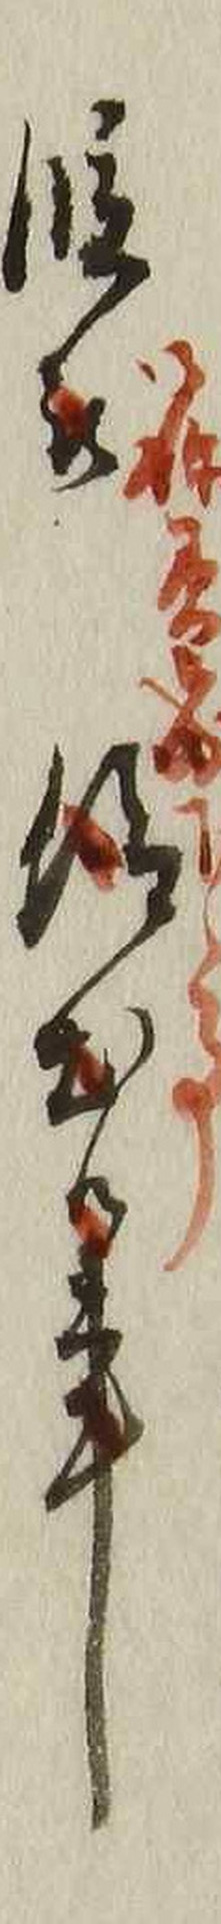被仰付候事
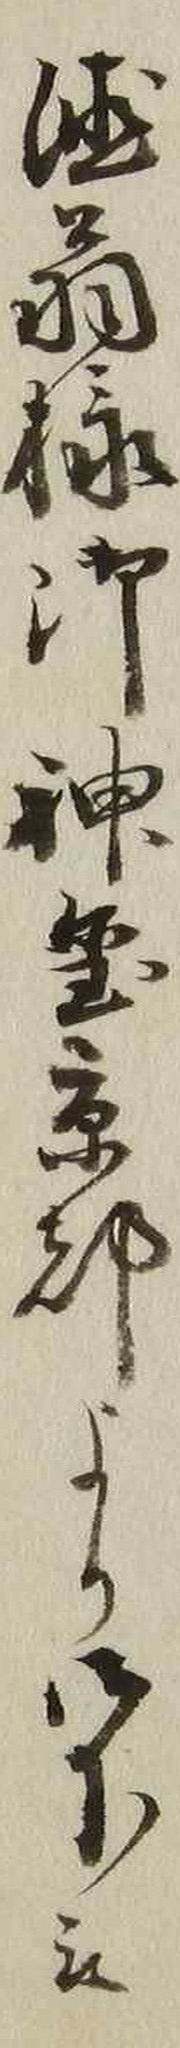徳翁様御神璽京部より御下被
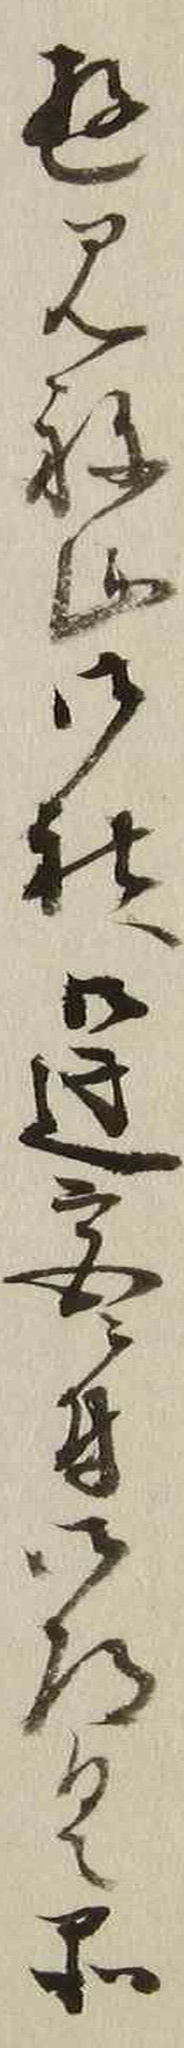遊見禰山御社へ御遷宮ニ付御道具品
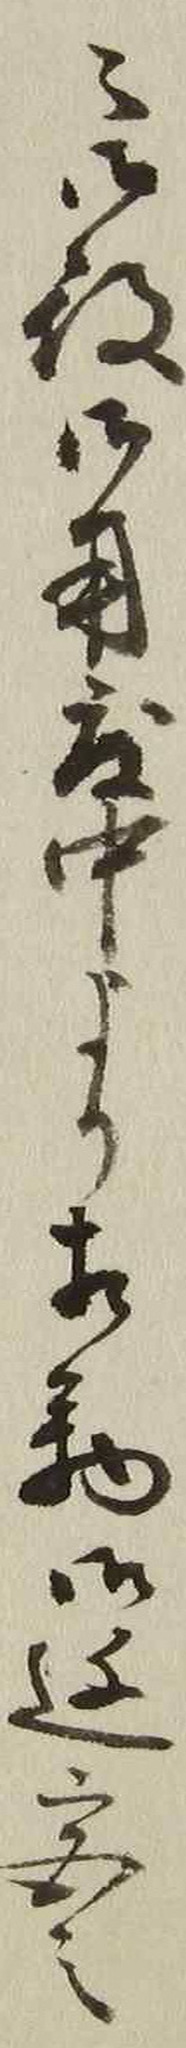々御役御用夏中より相勤御遷宮之
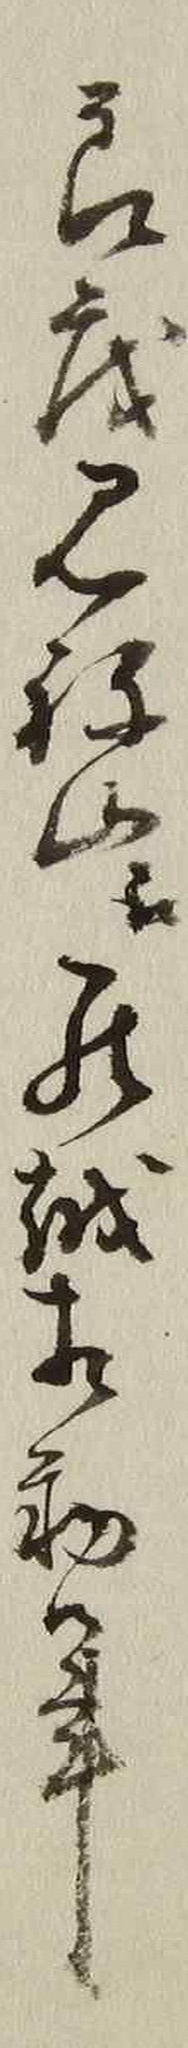節茂見禰山江罷越相勤候事
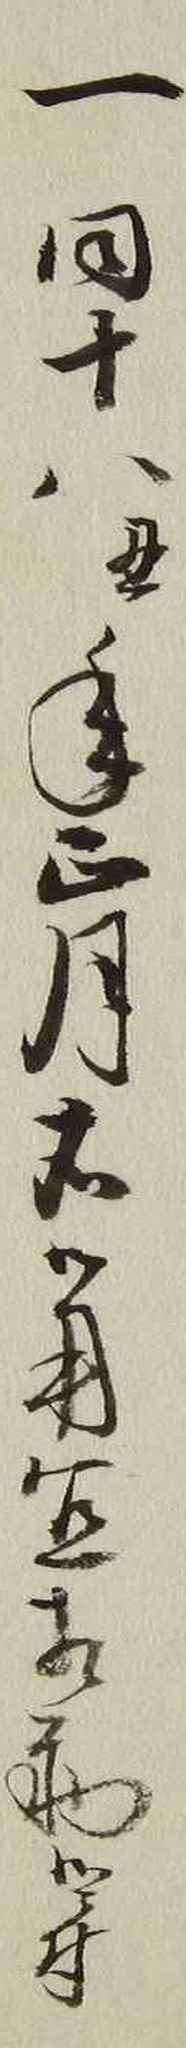一同十八丑年正月右御用宜相勤候ニ付
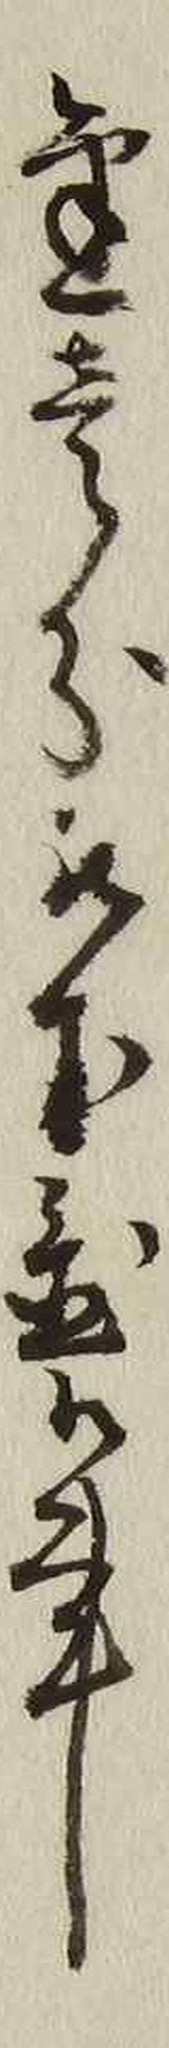金壱分被下置候事
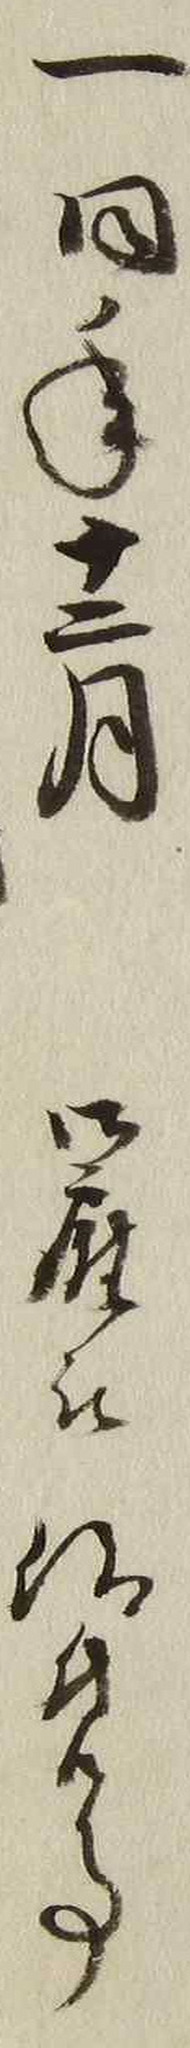一同年十二月御雇被仰付候事
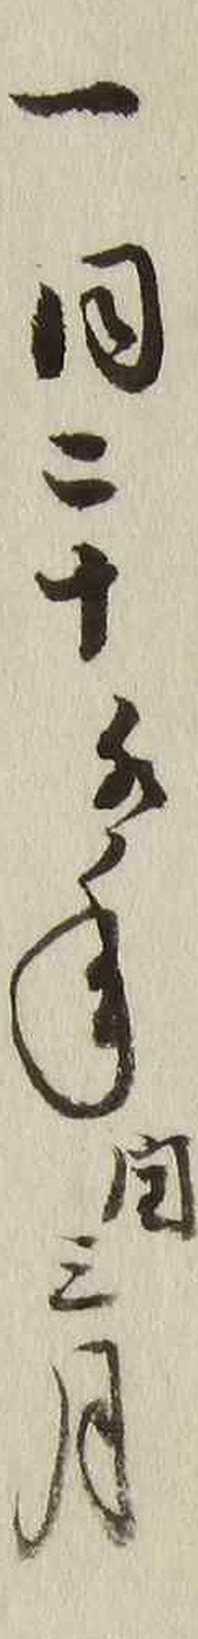一同二十卯年閏三月
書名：諸士系譜　巻之39　は之部7
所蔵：会津若松市立会津図書館
